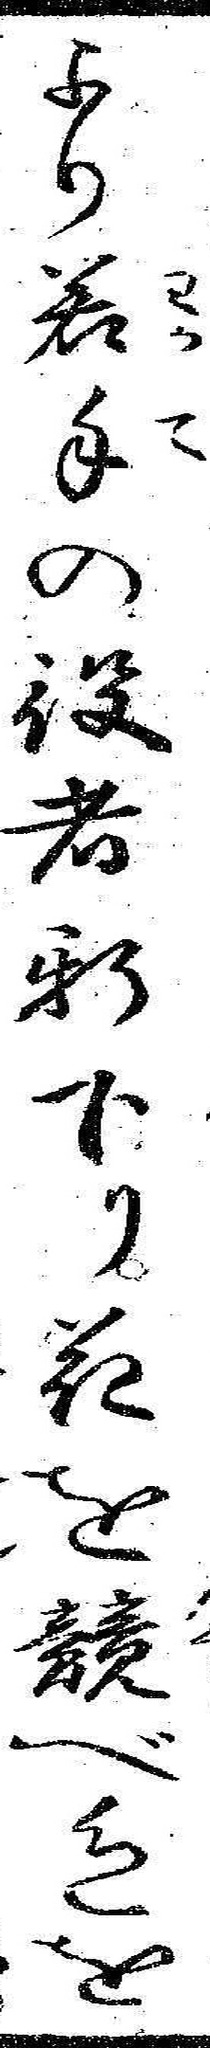より若手の役者新下り花を競べ色を
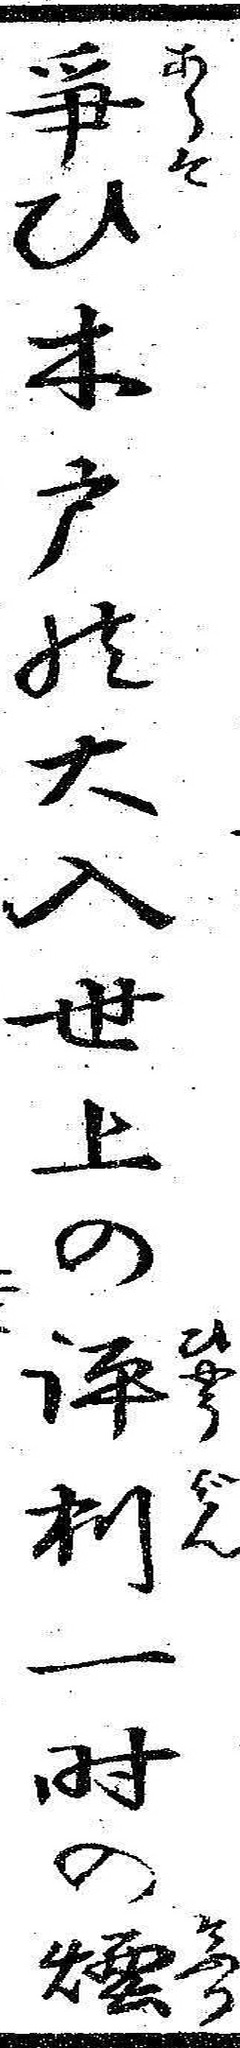争ひ木戸の大入世上の評判一時の煙
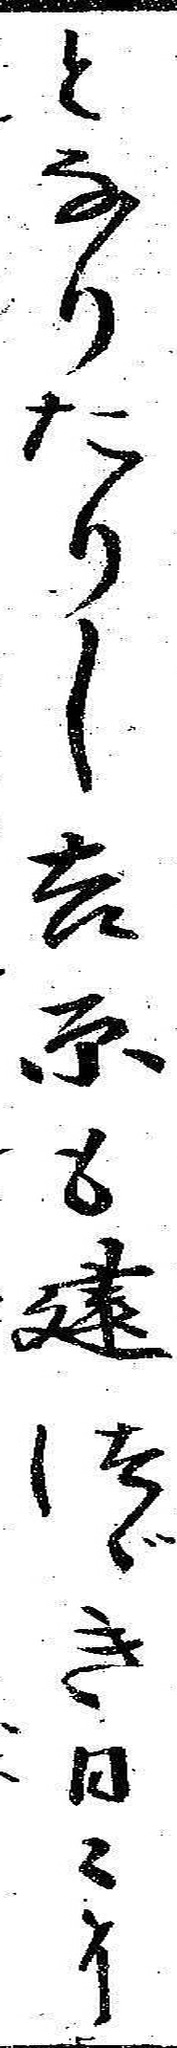となりたりし吉原も建つゞき日々に
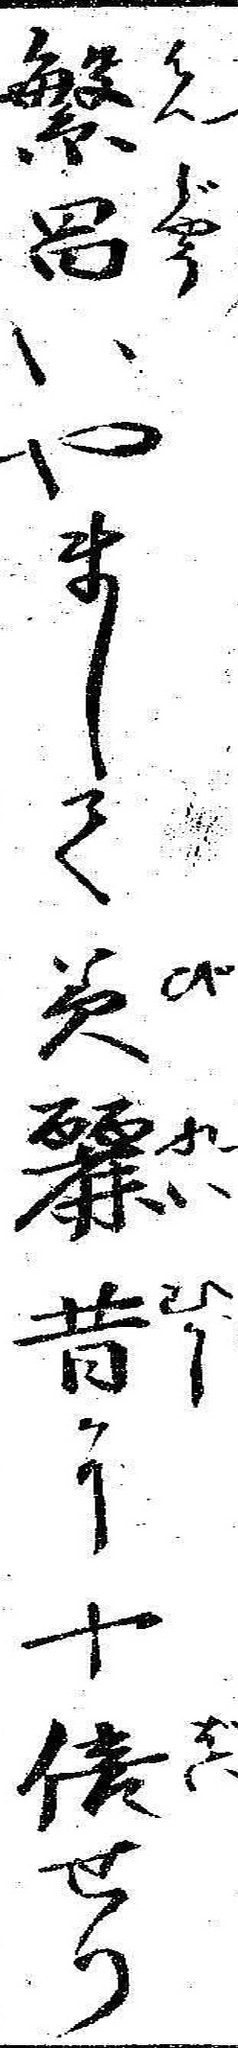繁昌いやまして美麗昔に十倍せり
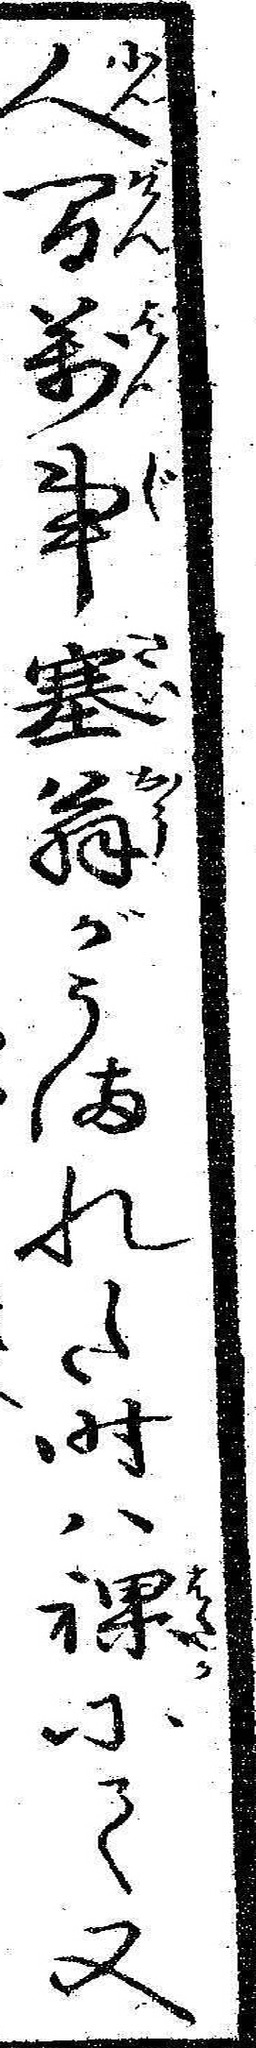人間万事塞翁がうまれた時は裸にて又
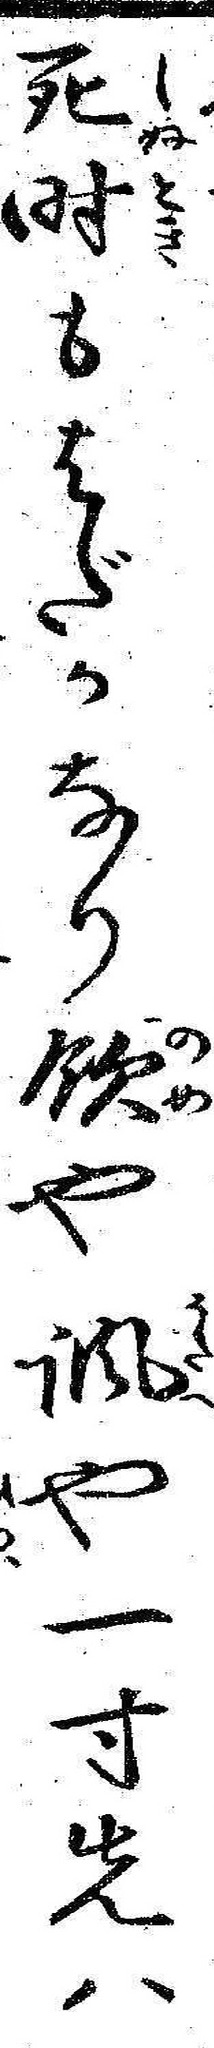死時もはだかなり飲めや諷や一寸先は
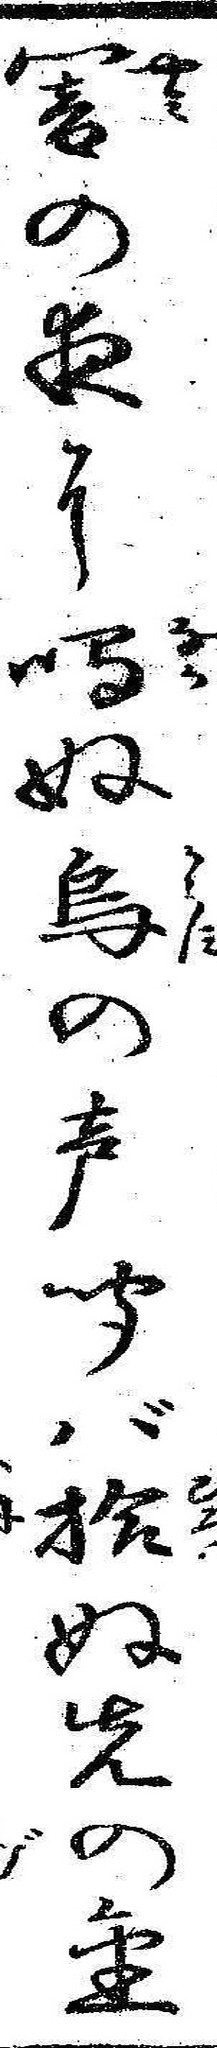闇の夜に鳴ぬ烏の声聞ば拾ぬ先の金
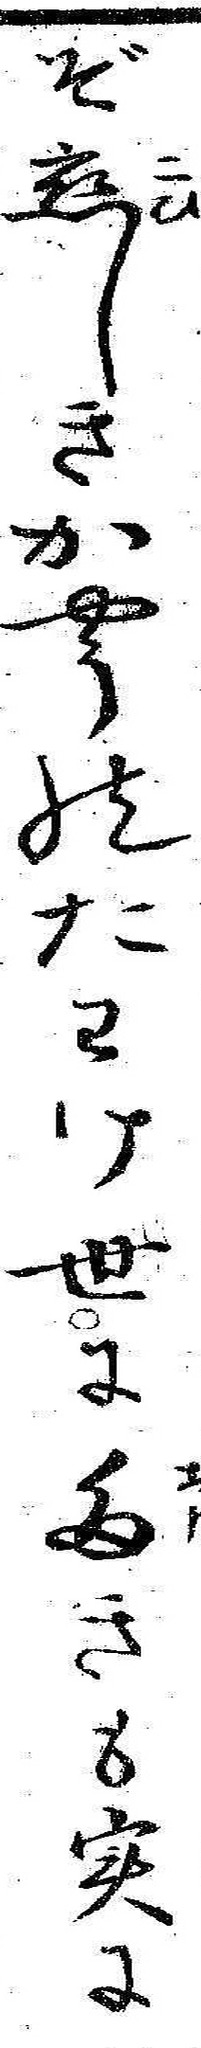ぞ恋しきかやうのたわけ世に多きも実に
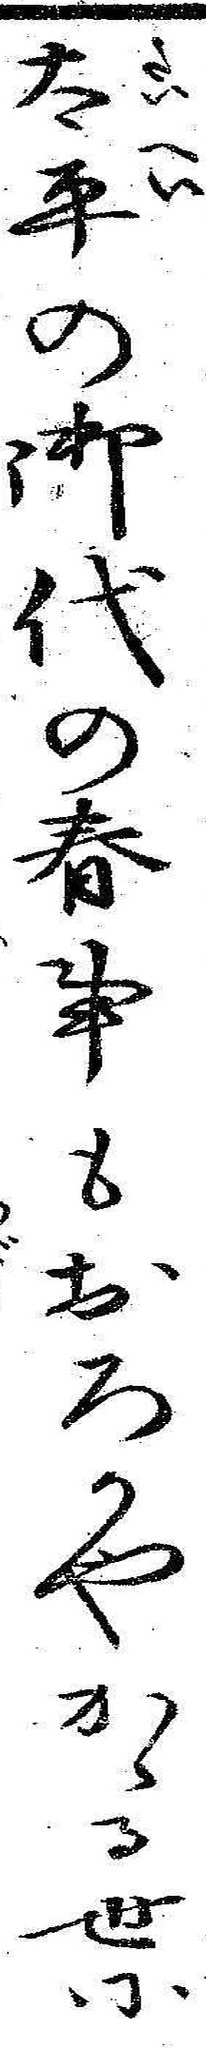太平の御代の春事もおろかやかゝる世に
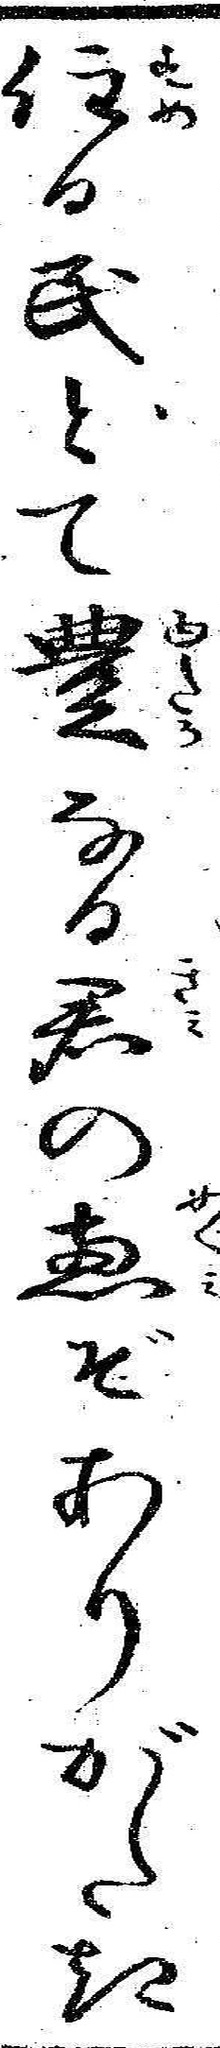住る民とて豊なる君の恵ぞありがたき

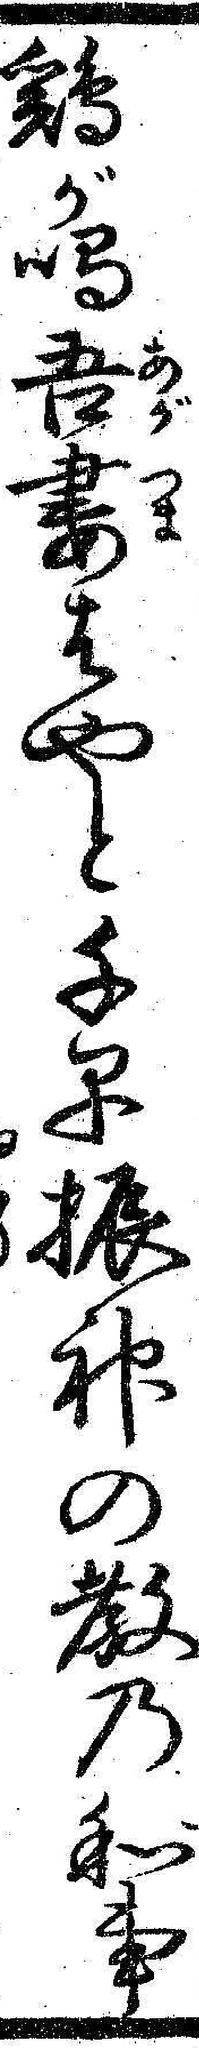鶏が鳴吾妻はやと千早振神の教の和事
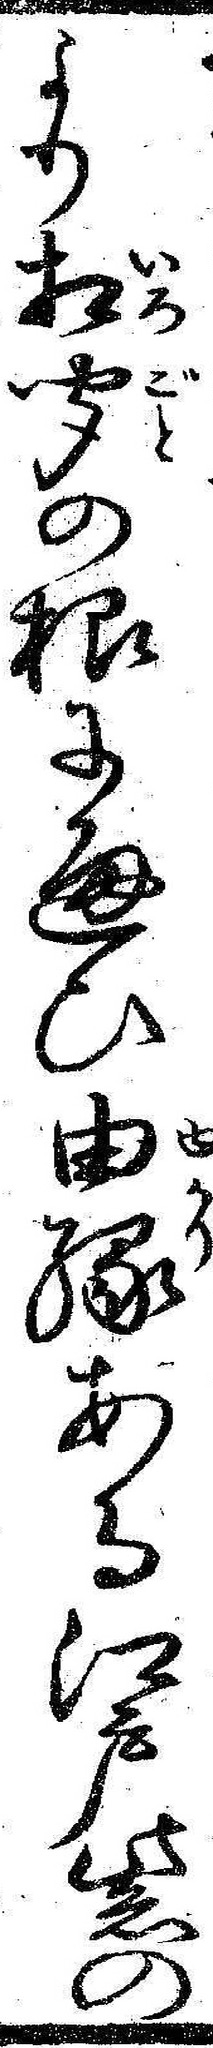より相聞の根に通ひ由縁ある江戸紫の
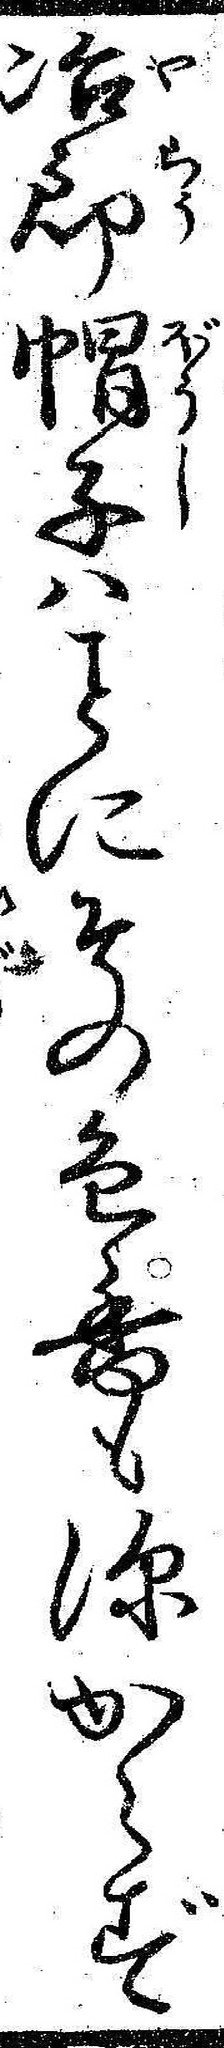冶郎帽子はことにその色香も深からず
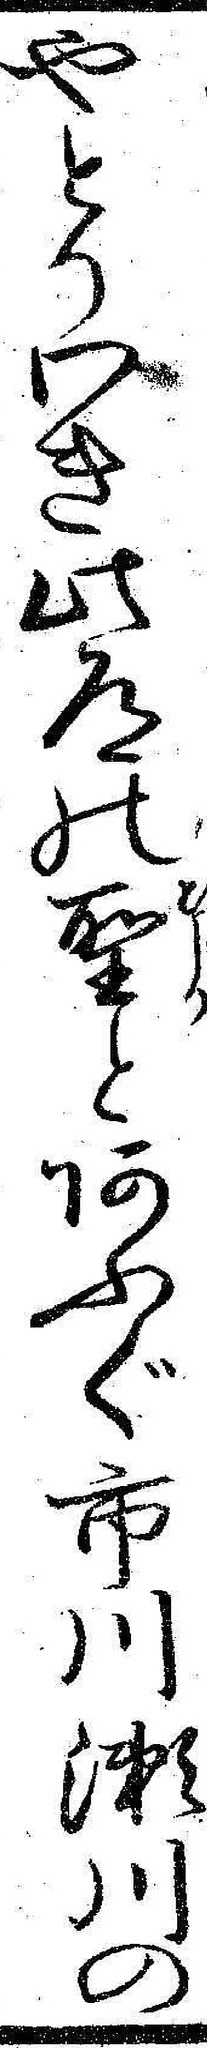やとりわき此道の聖とあふぐ市川瀬川の
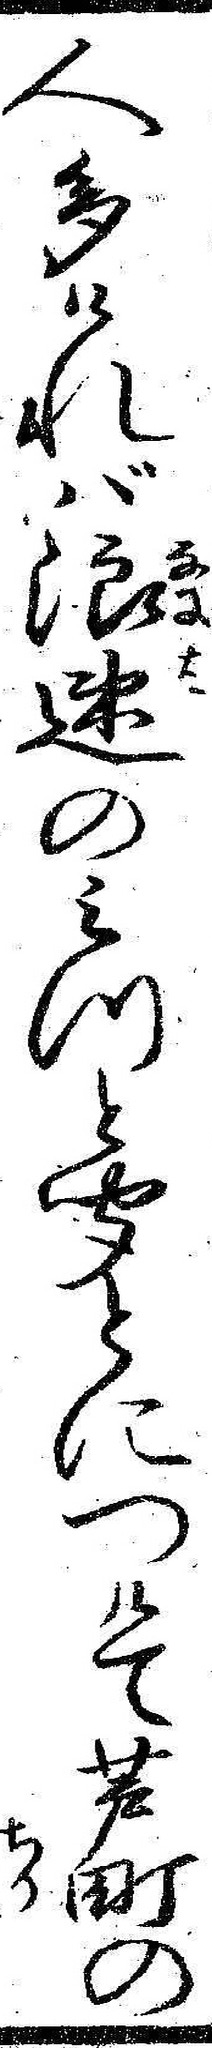人多ければ浪速のみつと聞とにつけて芦町の
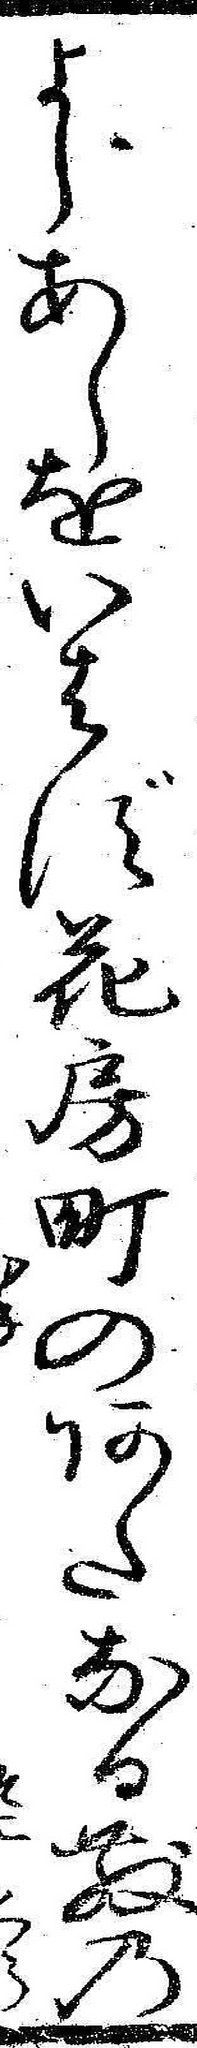よしあしをいはず花房町のあたなる散の
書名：根無草後編
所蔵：国文学研究資料館
